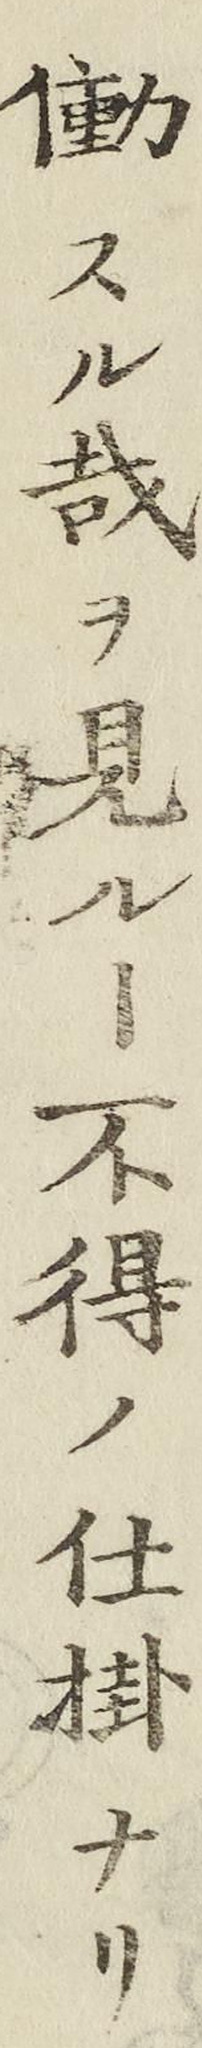働スル哉ヲ見ルー不得ノ仕掛ナリ
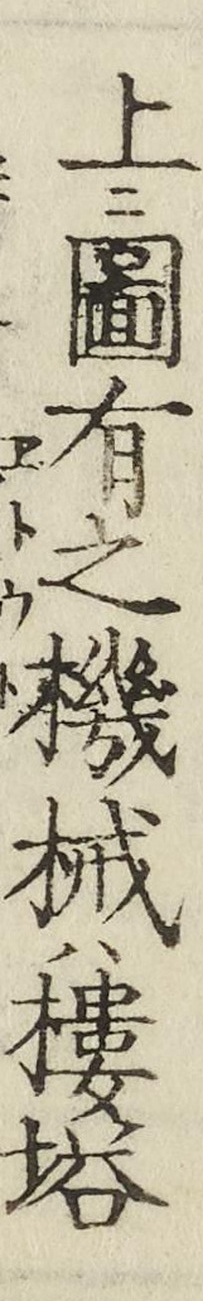上ニ図有之機械ハ楼塔
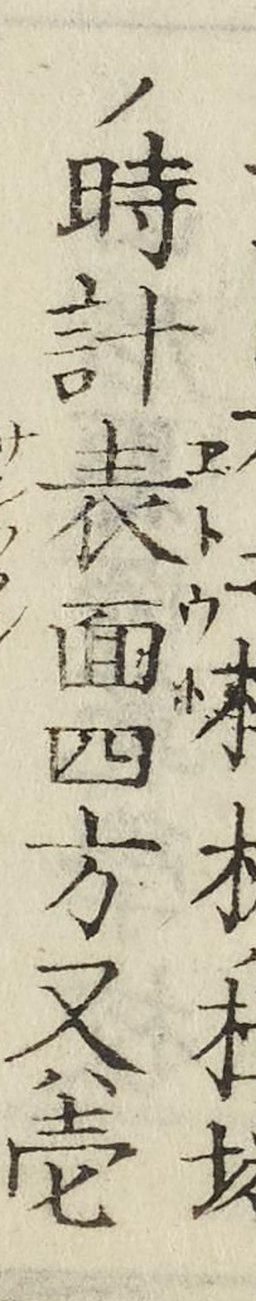ノ時計表面四方又ハ壱
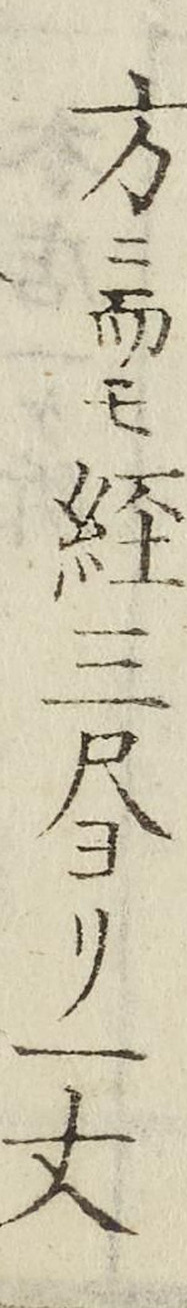方ニ而モ経三尺ヨリ一丈
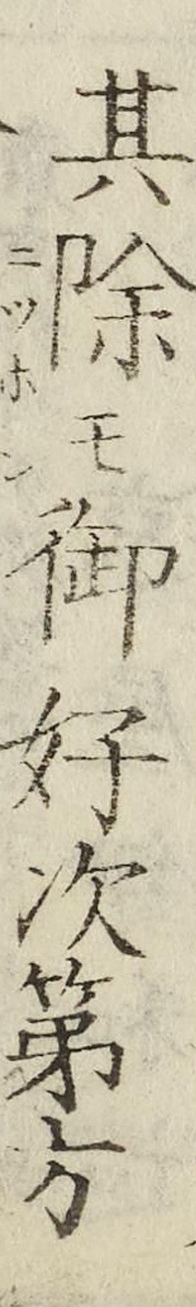其除モ御好次第方
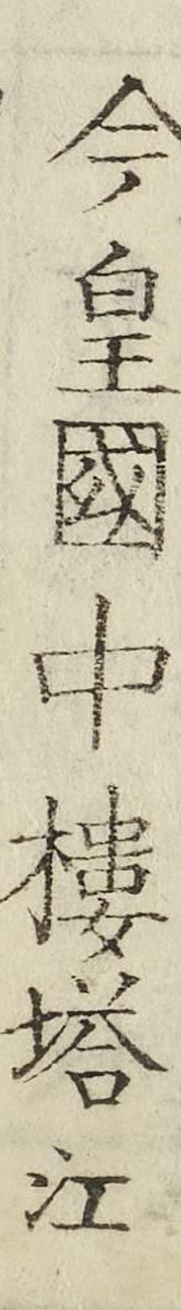今皇国中楼塔え
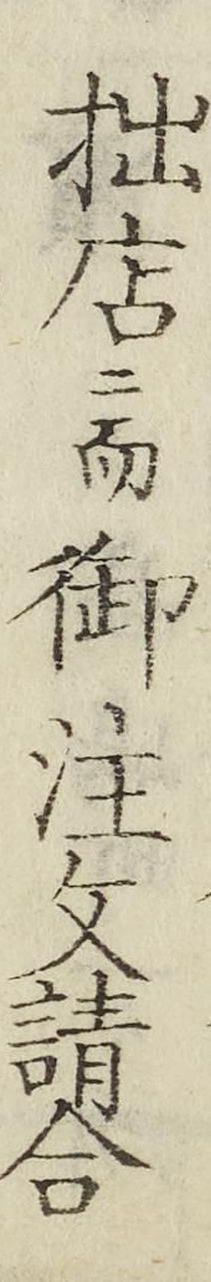拙店ニ而御注文請合
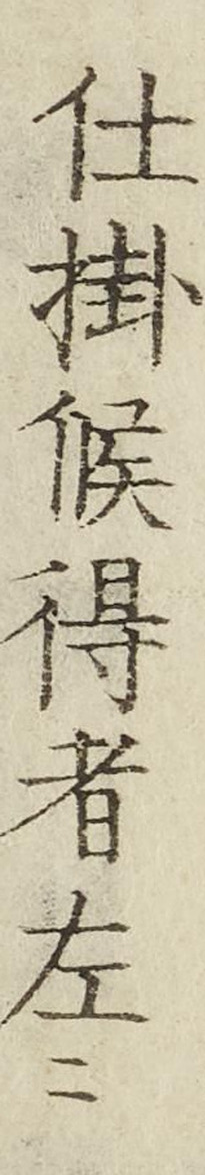仕掛候得は左ニ

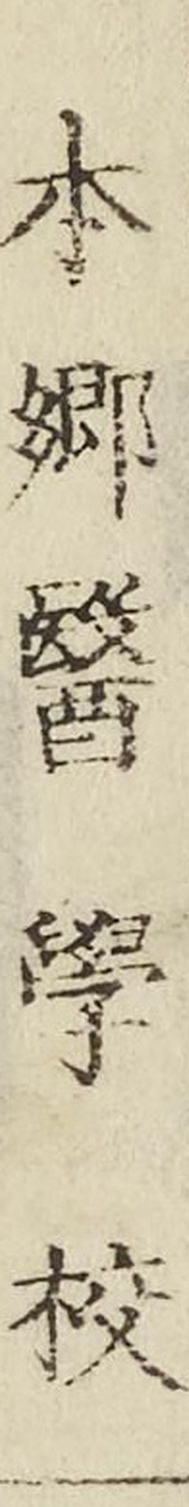本郷医学校
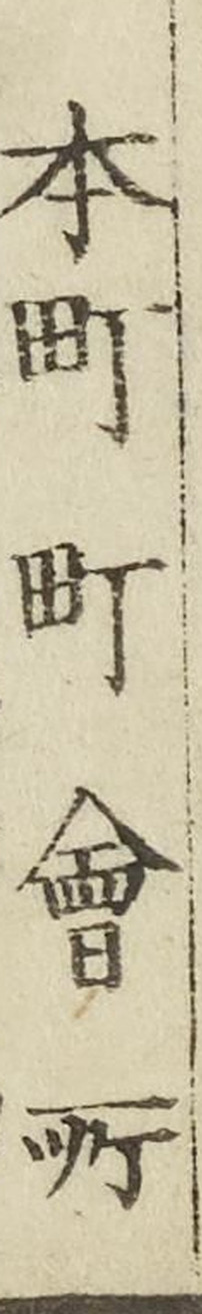本町町会所
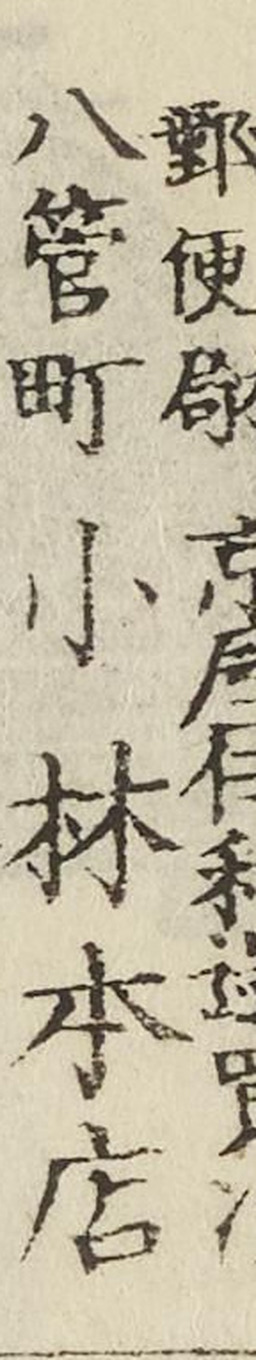八管町小林本店
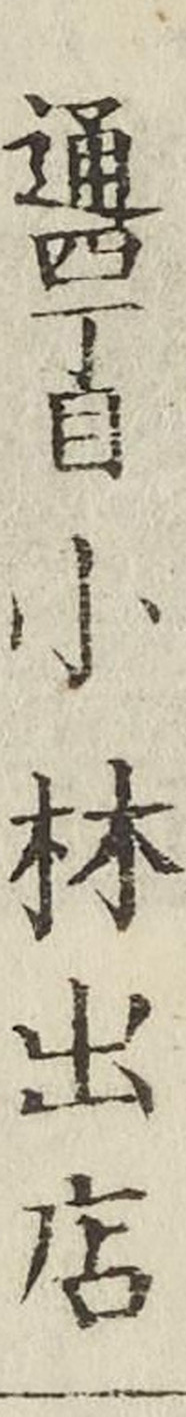通四丁目小林出店
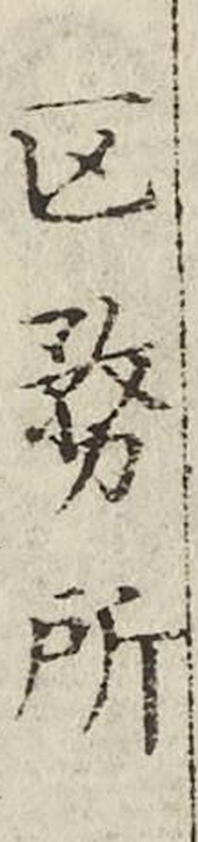区務所
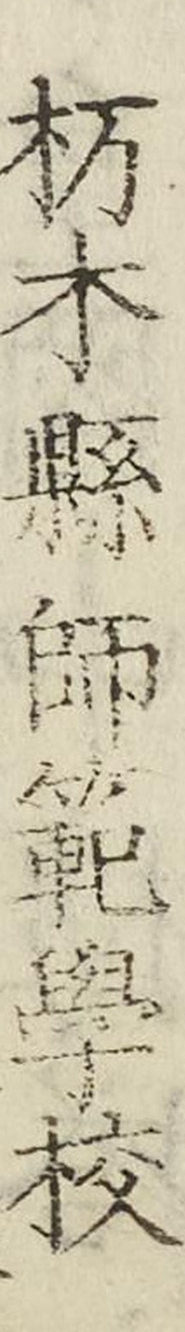朽木県師範学校
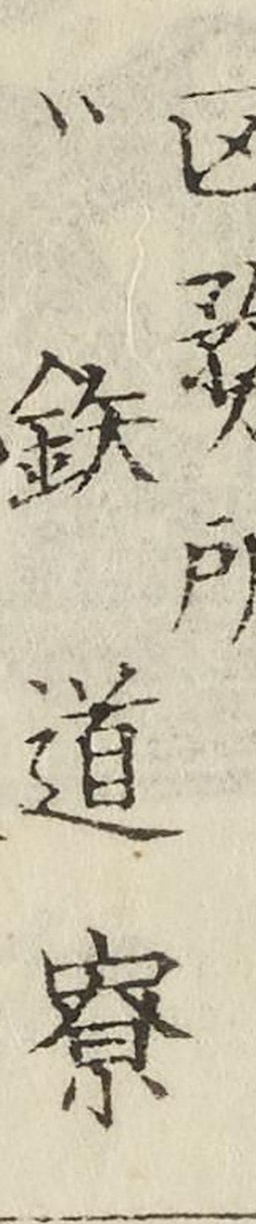〃鉄道寮
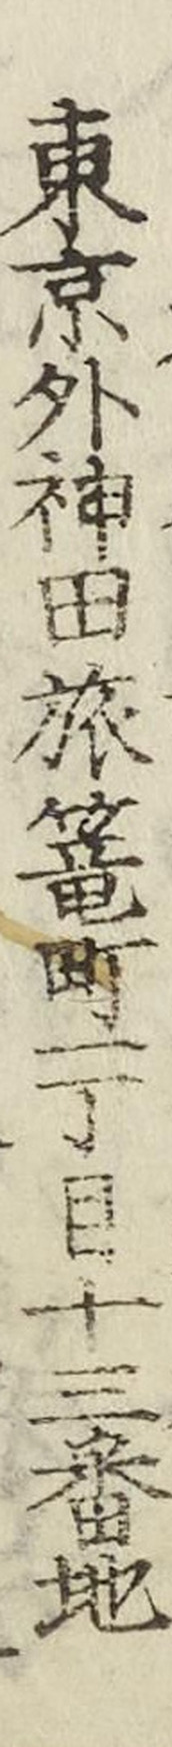東京外神田旅篭町一丁目十三番地
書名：[時計に関する冊子]
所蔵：東京大学地震研究所図書室 Earthquake Research Institute Library, The University of Tokyo, JAPAN
